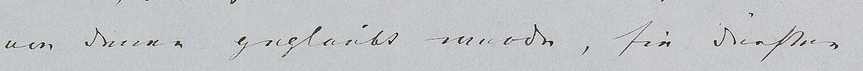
von denen geglaubt werde, sie dürften
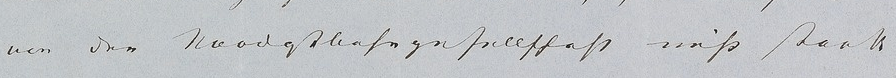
von der Nordostbahngesellschaft nicht stark
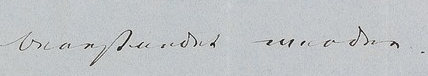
beanstandet werden.
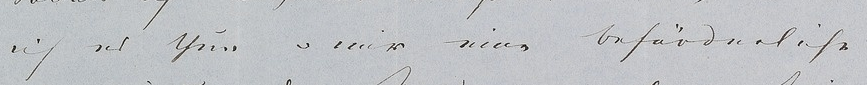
ich es thun & mir eine beförderliche
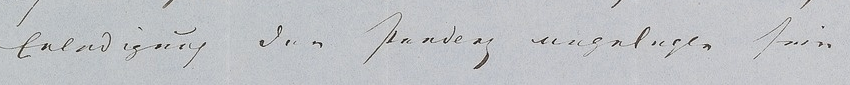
Erledigung den Pendenz angelegen sein
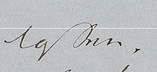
lassen.
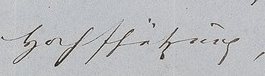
Hochschätzung,
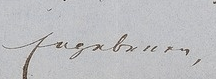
Ergebenen,
